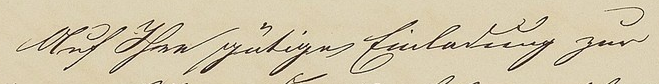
Auf Ihre gütige Einladung zur
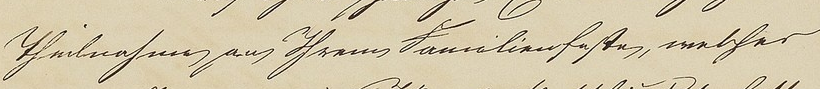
Theilnahme an Ihrem Familienfeste, welches
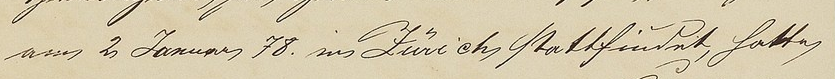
am 2. Januar 78. in Zürich stattfindet, hatte
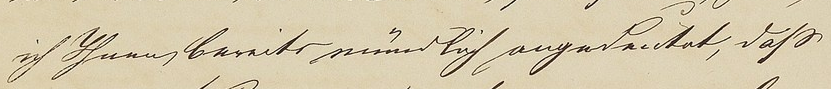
ich Ihnen bereits mündlich angedeutet, daß
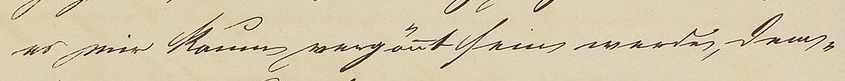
es mir kaum vergönnt sein werde, dem-
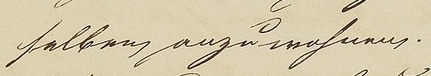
selben anzuwohnen.
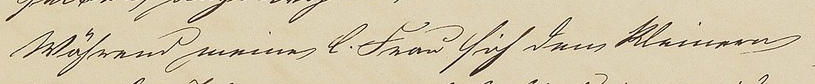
Während meine l. Frau sich dem kleinern
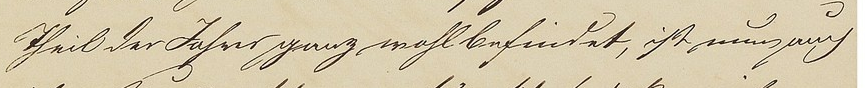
Theil des Jahres ganz wohl befindet, ist nun auch
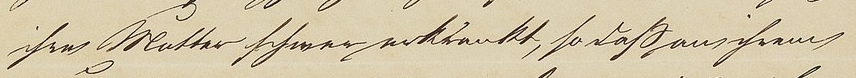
ihre Mutter schwer erkrankt, so daß an ihrem
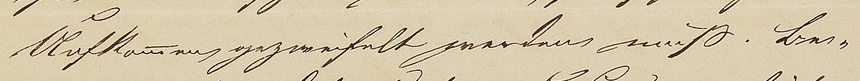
Aufkommen gezweifelt werden muß. Be-
